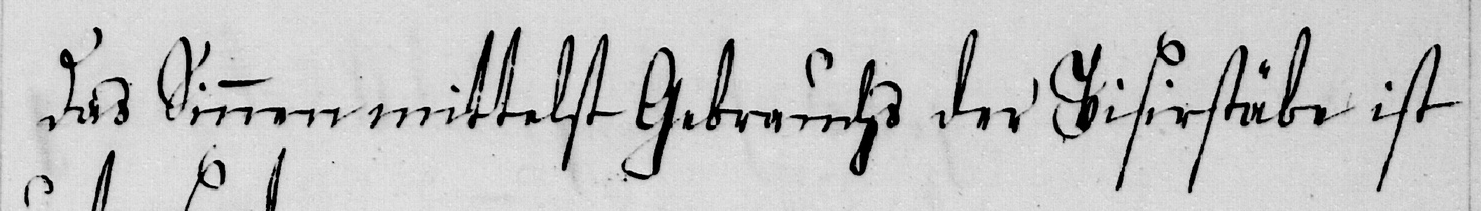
Das Sinnen mittelst Gebrauchs der Visirstäbe ist
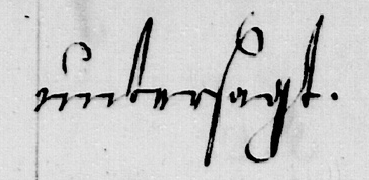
untersagt.
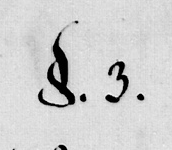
§. 3.
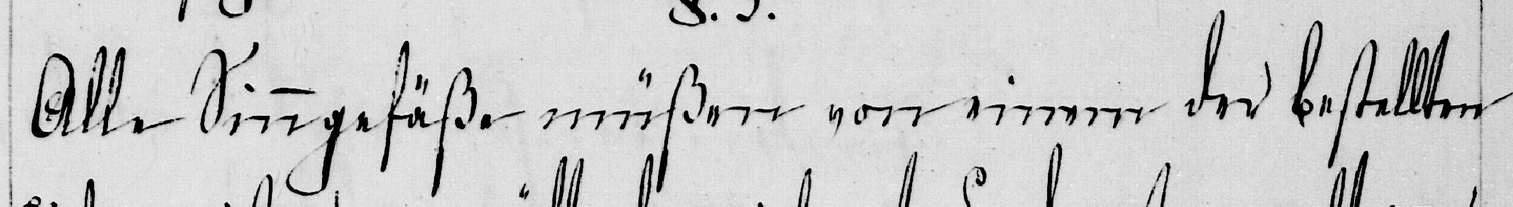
Alle Sinngefäße müßen von einem der bestellten
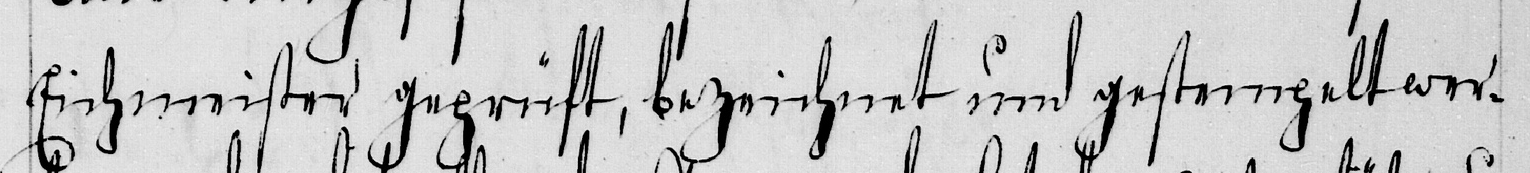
Eichmeister geprüft, bezeichnet und gestempelt wer¬
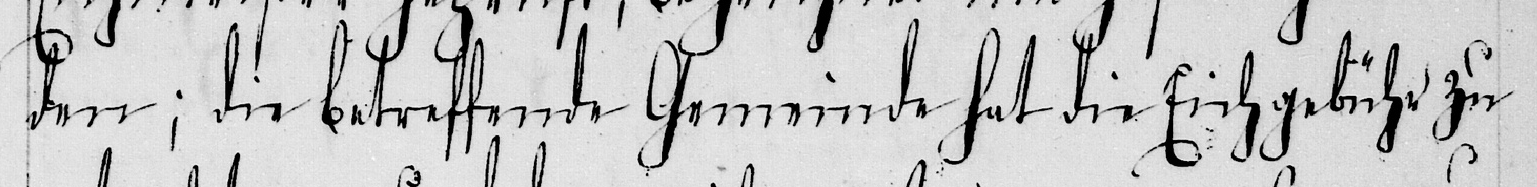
die betreffende Gemeinde hat die Eichgebühr zu
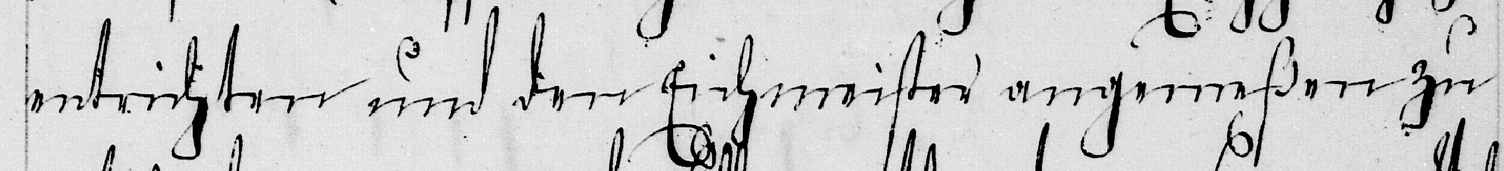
entrichten und den Eichmeister angemeßen zu
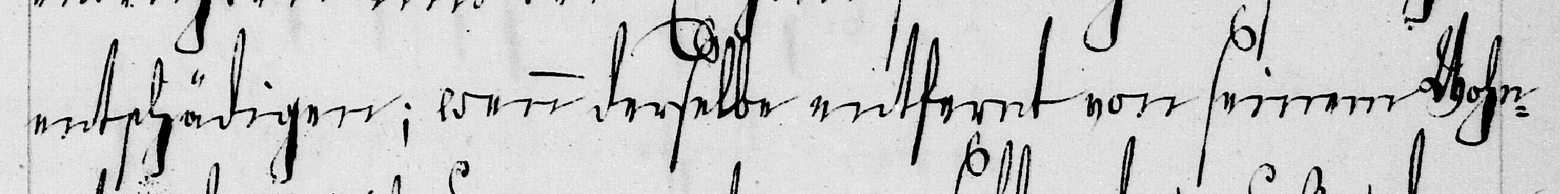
entschädigen; wenn derselbe entfernt von seinem Wohn¬
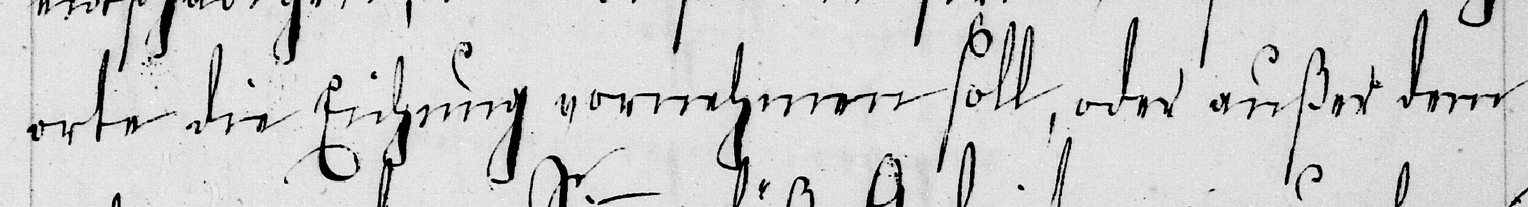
orte die Eichung vornehmen soll, oder außer dem
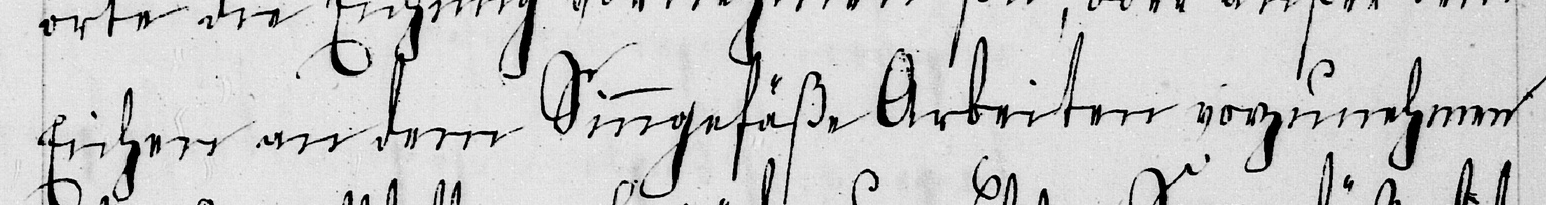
Eichen an dem Sinngefäße Arbeiten vorzunehmen
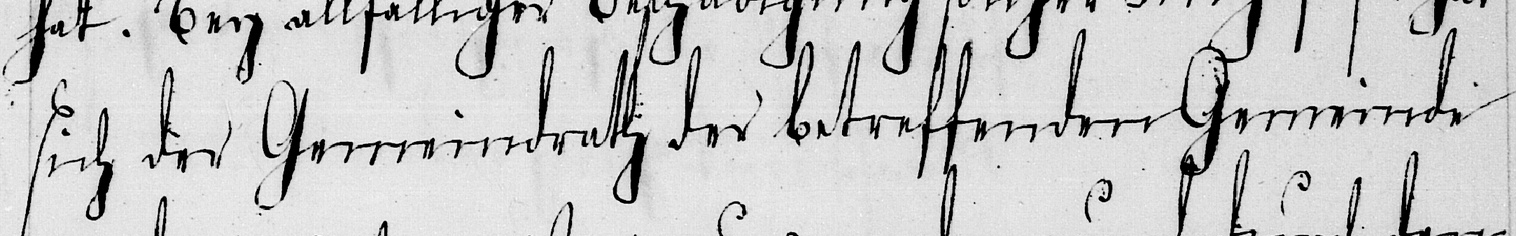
sich der Gemeindrath der betreffenden Gemeinde
